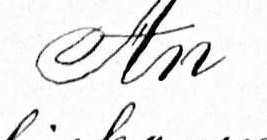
An
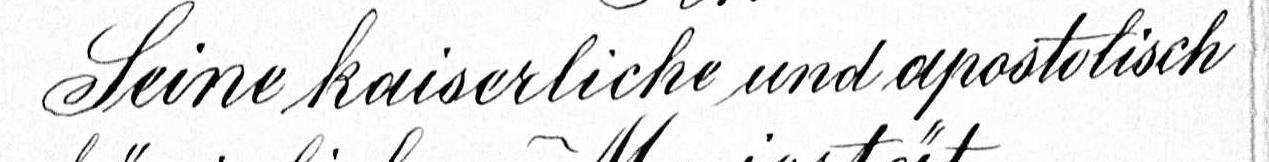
Seine kaiserliche und apostolisch
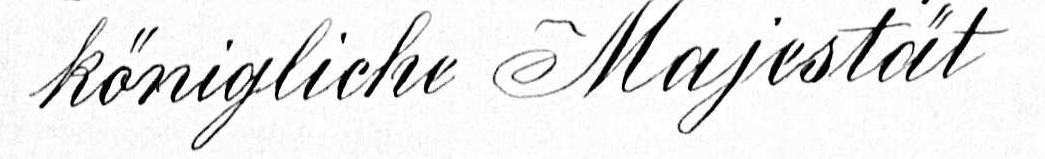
königliche Majestät
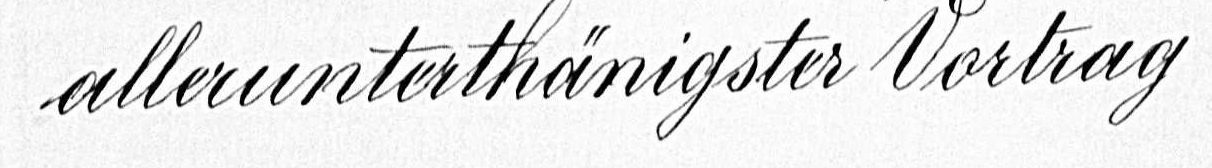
allerunterthänigster Vortrag
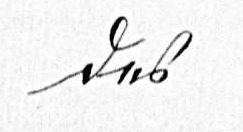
des
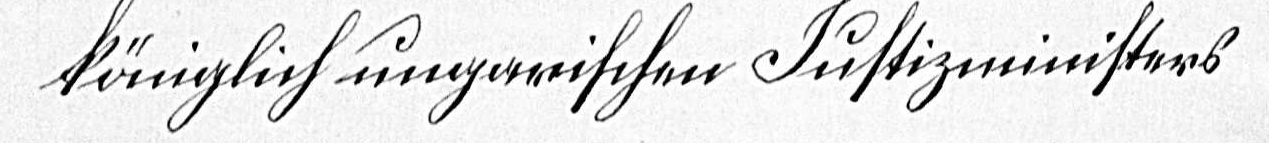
königlich ungarischen Justizministers
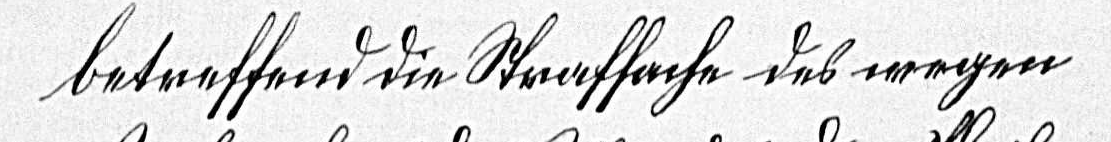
betreffend die Strafsache des wegen
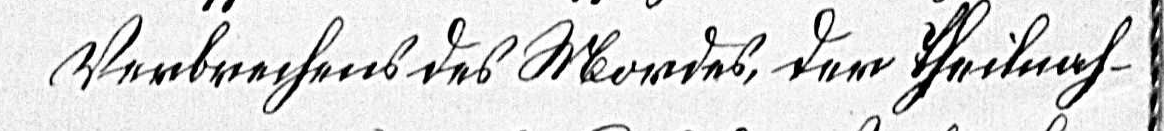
Verbrechens des Mordes, der Theilnah¬
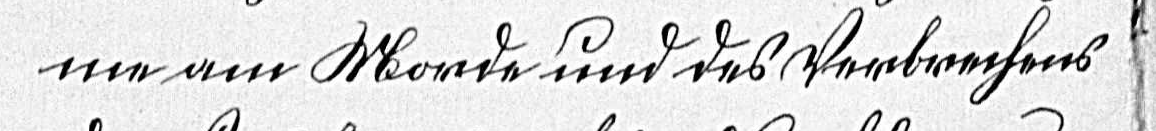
me am Morde und des Verbrechens
